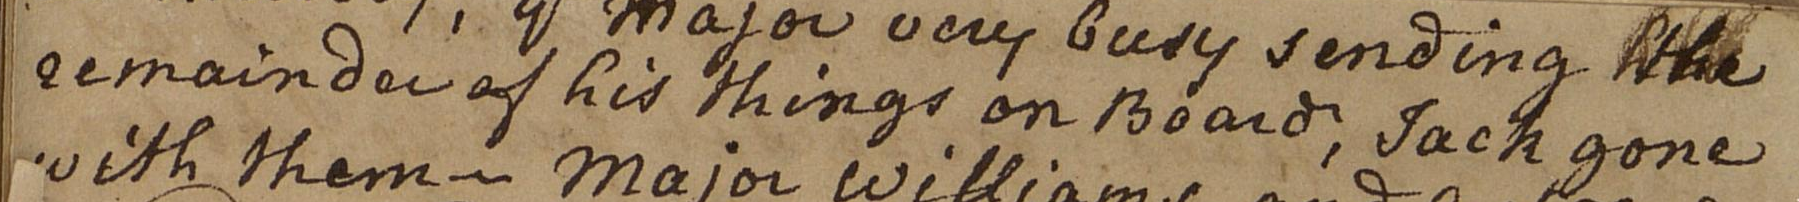remainder of his things on Board, Jack gone
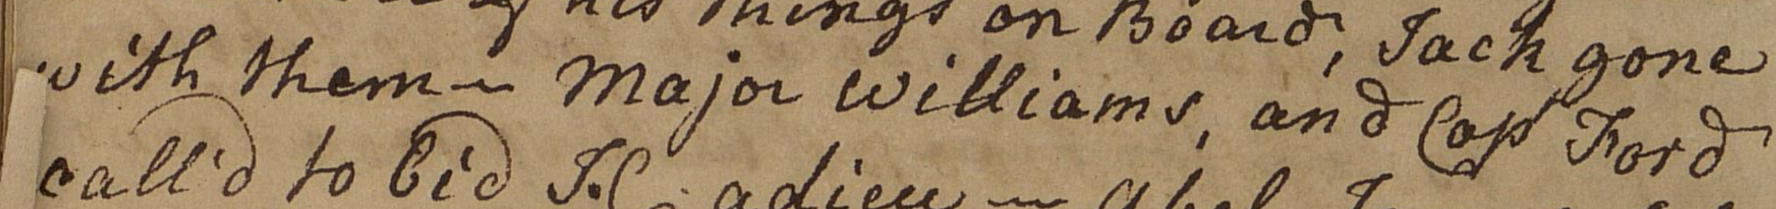with them- Major Williams, and Capt Ford
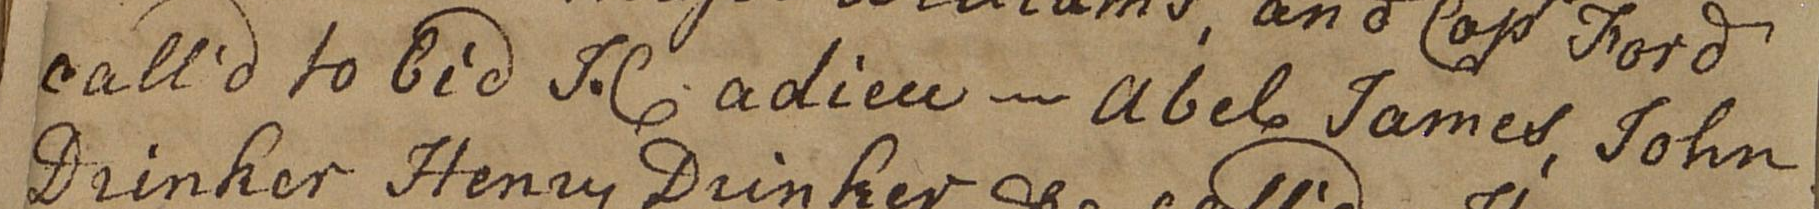call'd to bid J.C adieu- Abel James, John
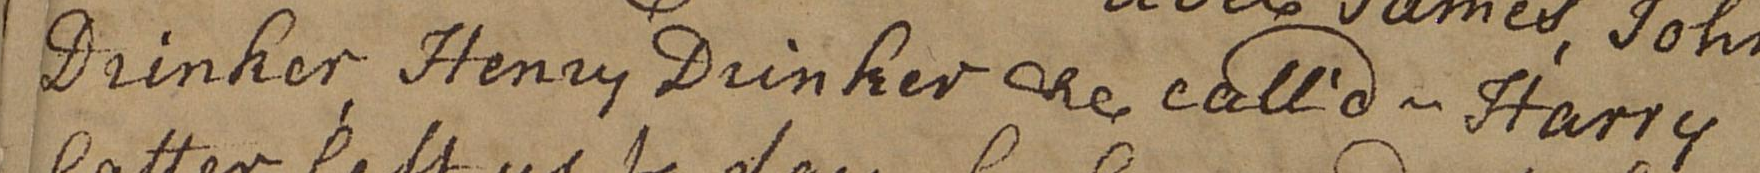Drinker Henry Drinker &c call'd- Harry
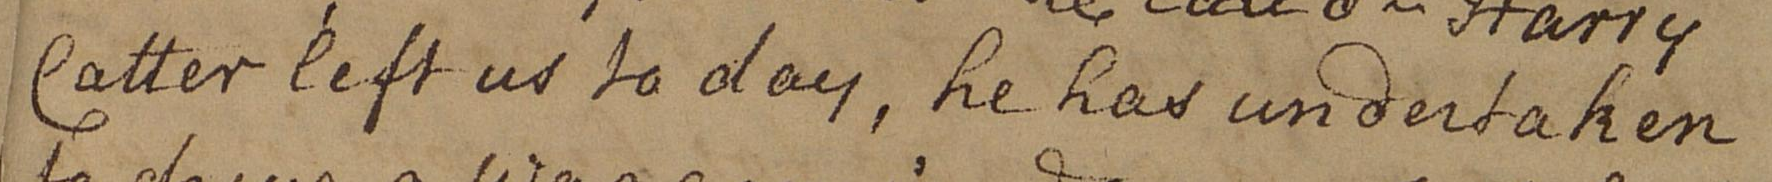Catter left us to day, he has undertaken
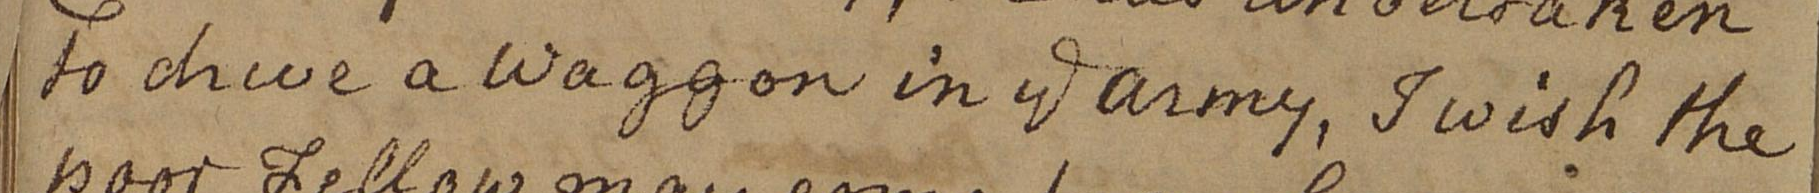to drive a waggon in y^e army, I wish the
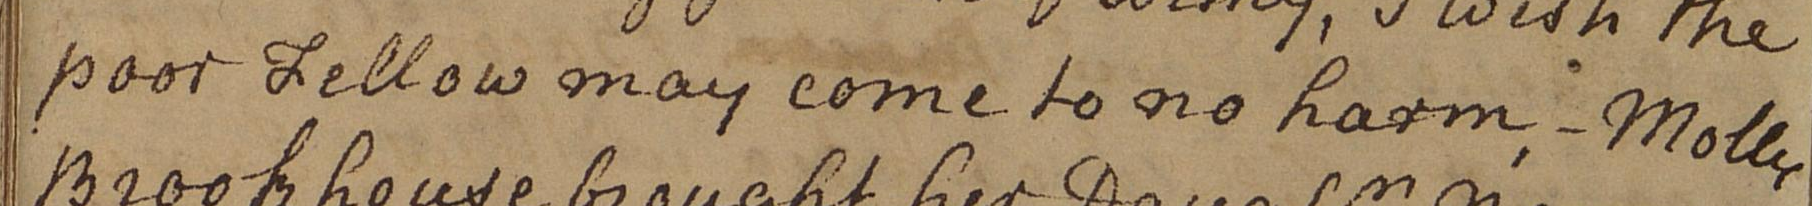poor Fellow may come to no harm,- Molly
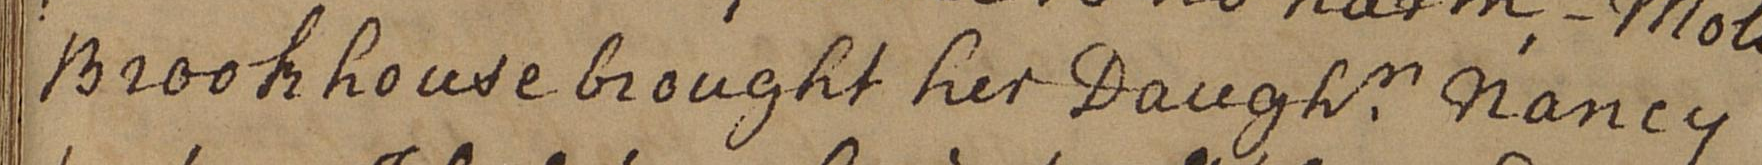Brookhouse brought her Daugh^r. Nancy
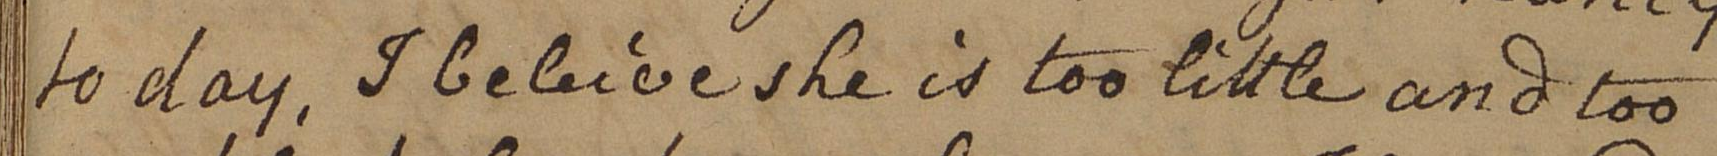to day, I beleive she is too little and too
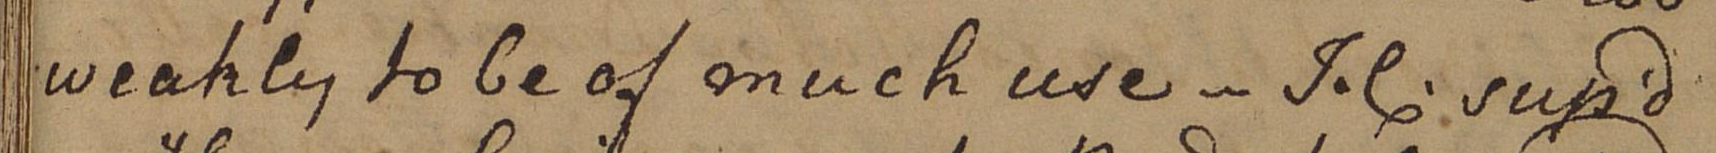weakly to be of much use- J.C. sup'd
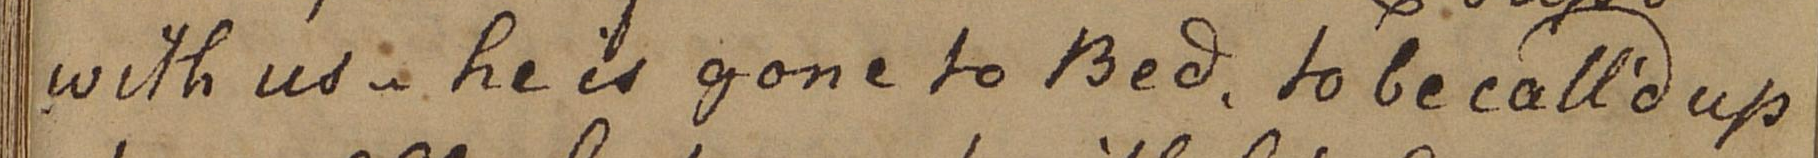with us- he is gone to Bed, to be call'd up
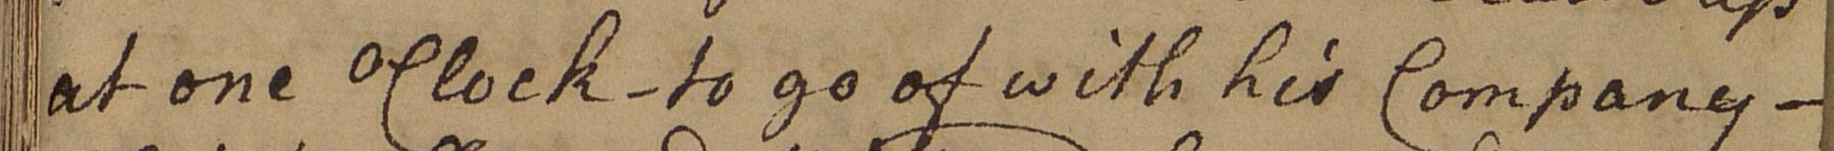at one ^o Clock-to go of with his Company-
